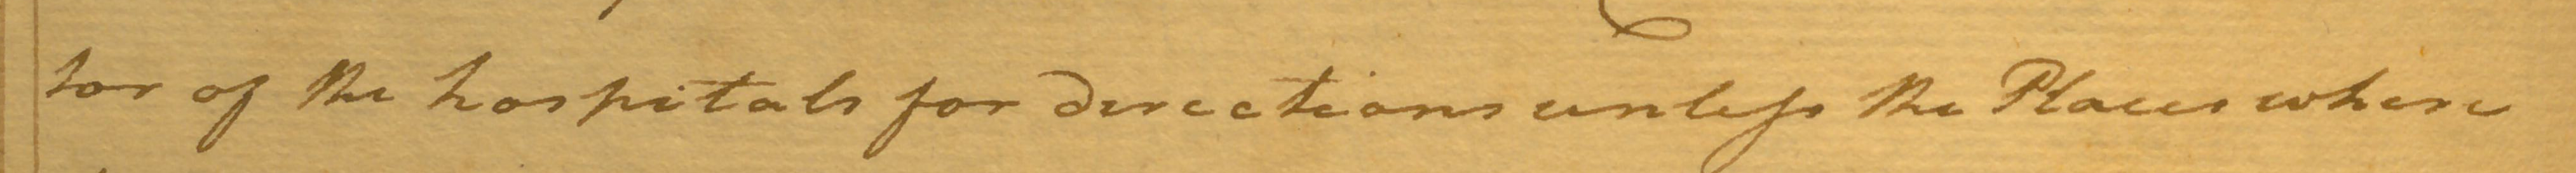tor of the hospitals for directions unless the Places where
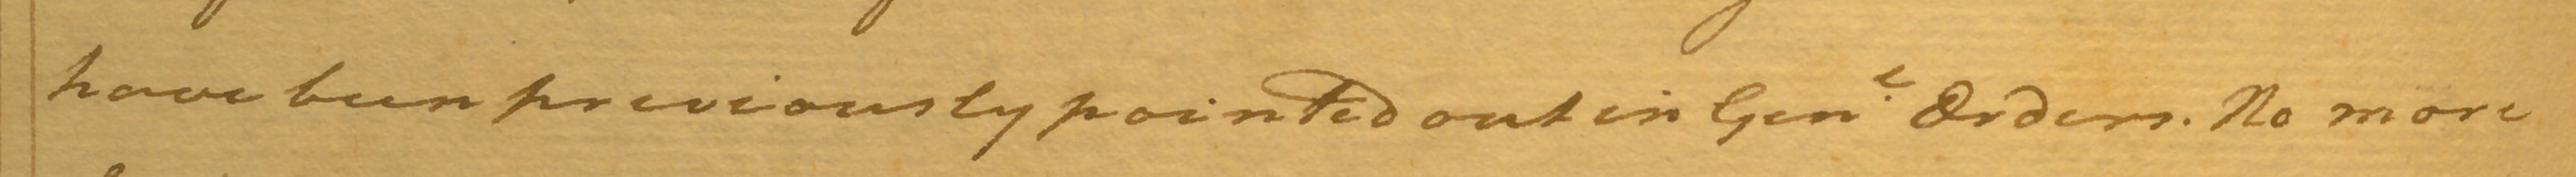have been previously pointed out in Gen^l. Orders. No more
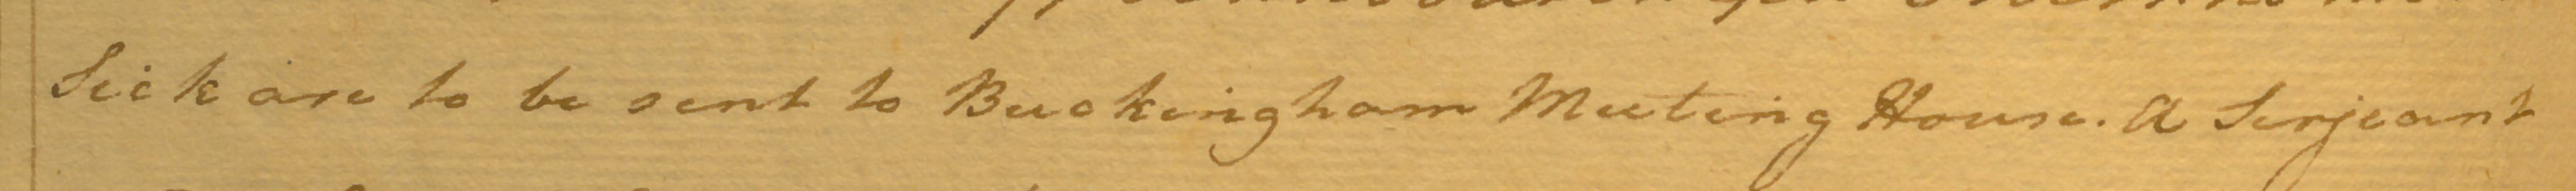Sick are to be sent to Buckingham Meeting House. A Serjeant
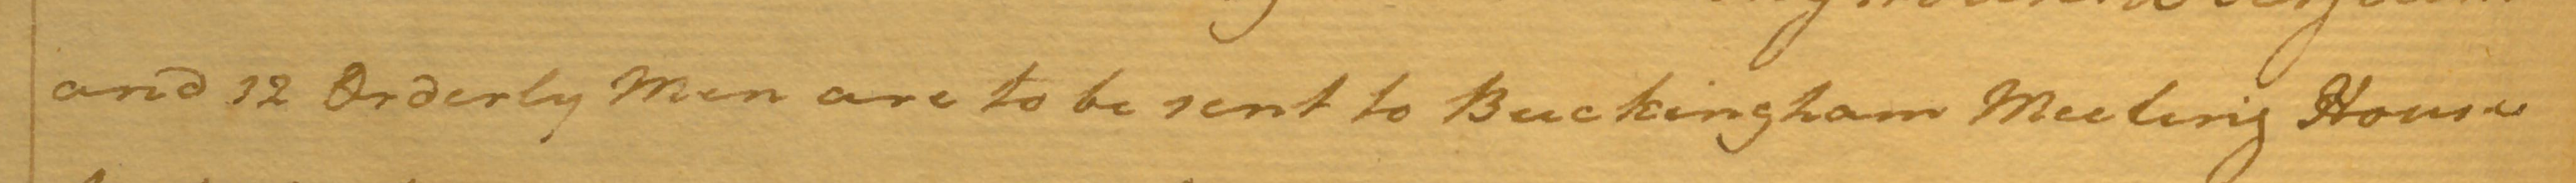and 12 Orderly Men are to be sent to Buckingham Meeting House
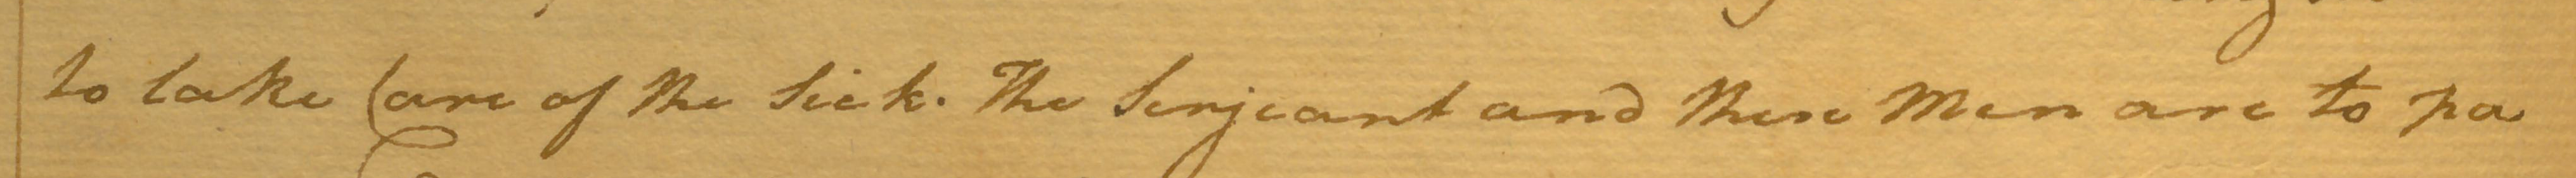to take Care of the sick. The serjeant and these Men are to pa
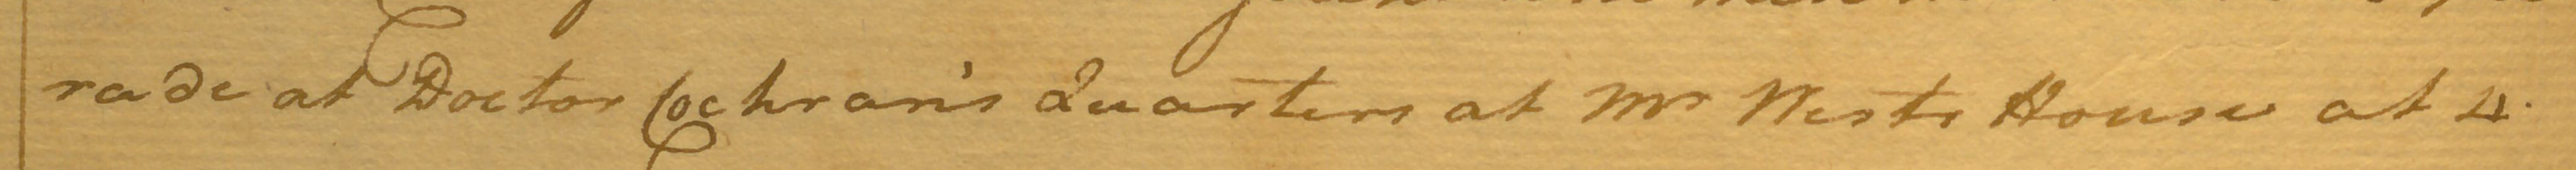rade at Doctor Cochran's Quarters at M^r Wests House at 4
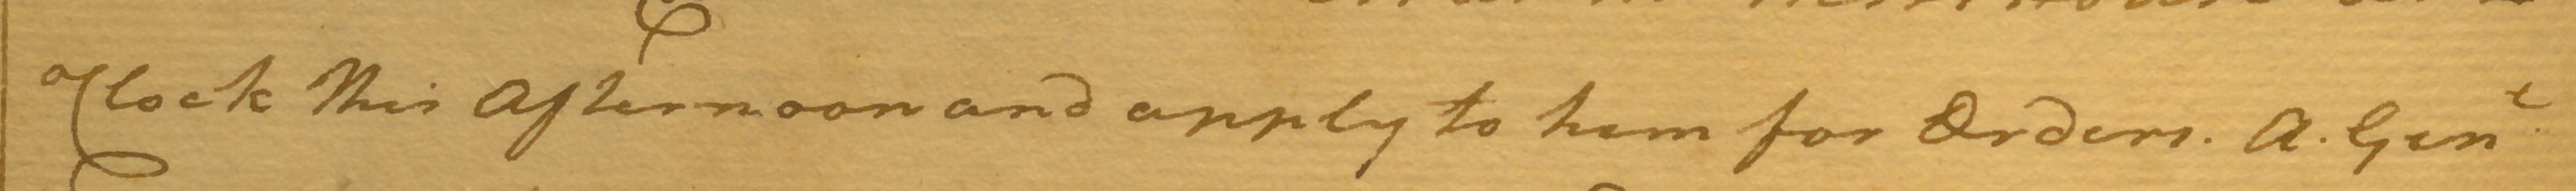^oClock this afternoon and apply to him for Orders. A Gen^l
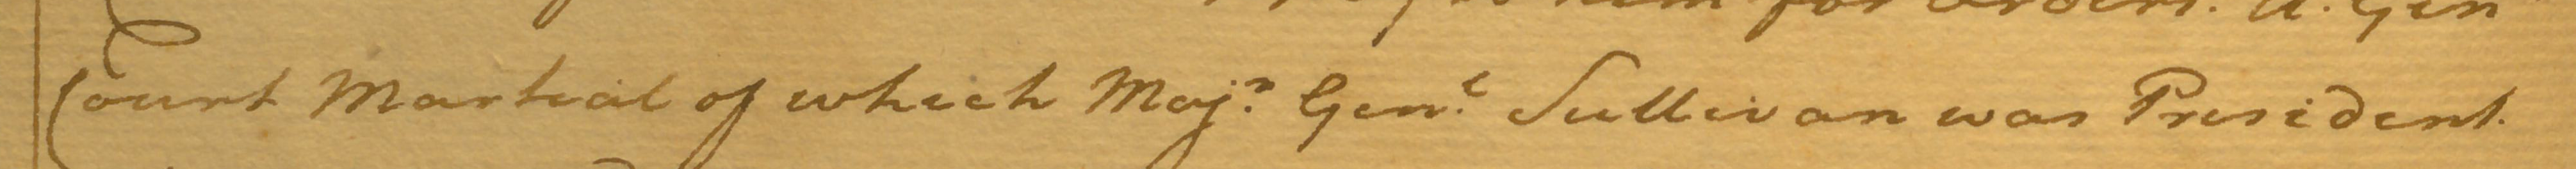Court Martial of which Maj^r. Gen^l. Sullivan was President
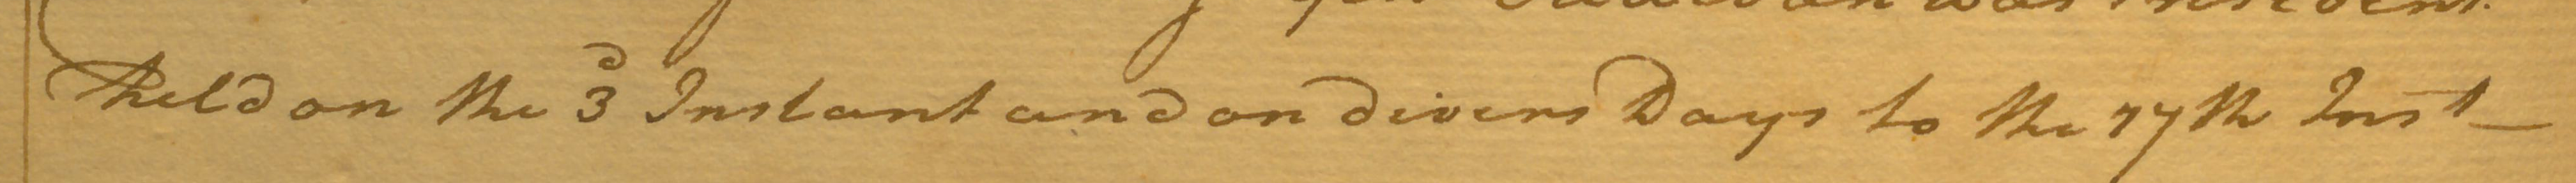held on the 3^d Instant and on divers Days to the 17th Inst-
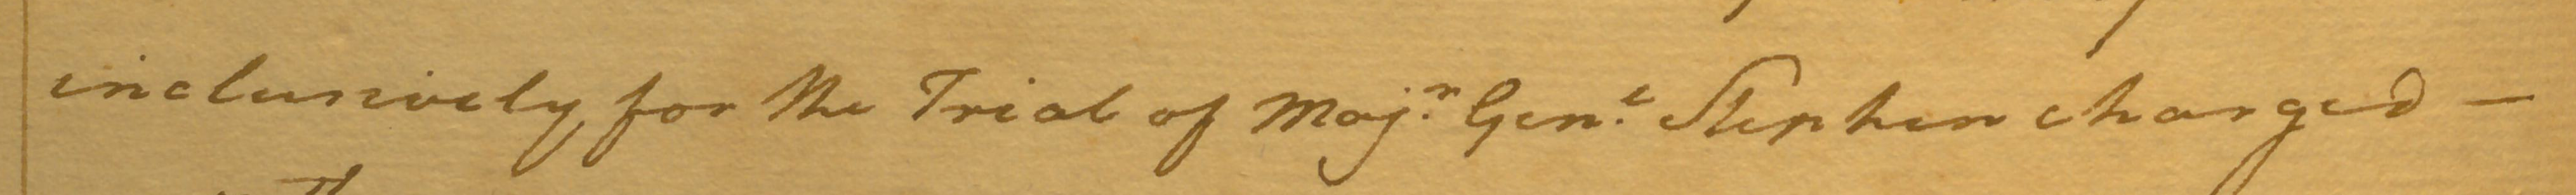inclusively for the Trial of Maj^r. Gen^l. Stephen charged-
